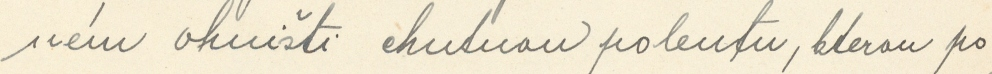ném ohništi chutnou polentu, kterou po
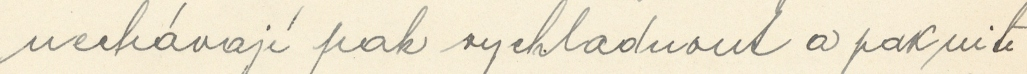nechávají pak vychladnout a pak nití
